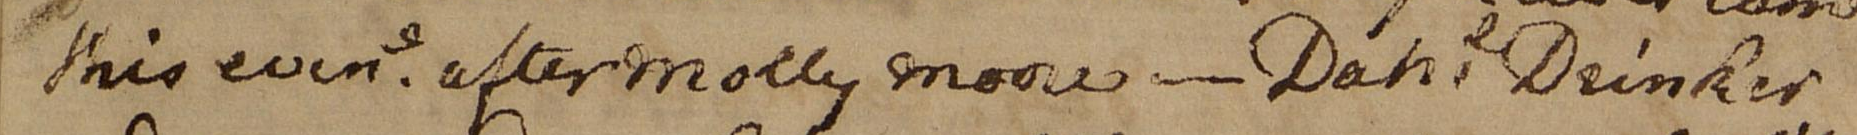this even^g. after Molly Moore- Dan^l. Drinker
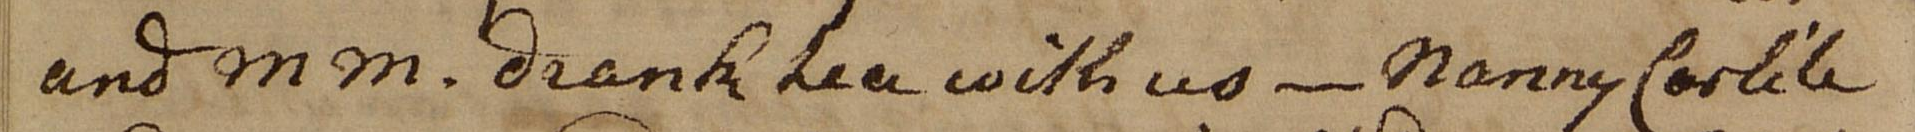and M M. drank tea with us- Nanny Carlile
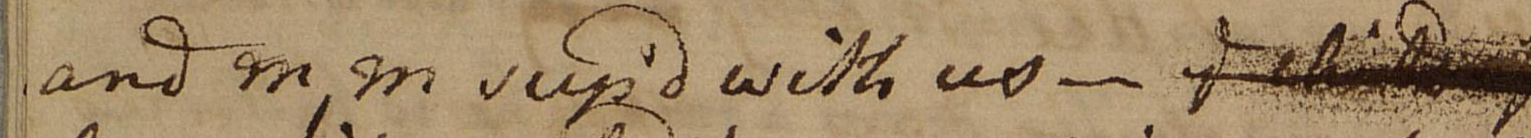and m m sup'd with us-
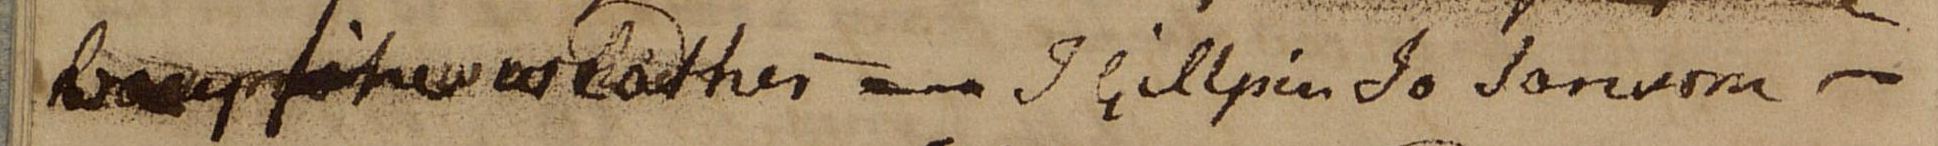[very fine] weather- I Gillpin Jo Sansom-
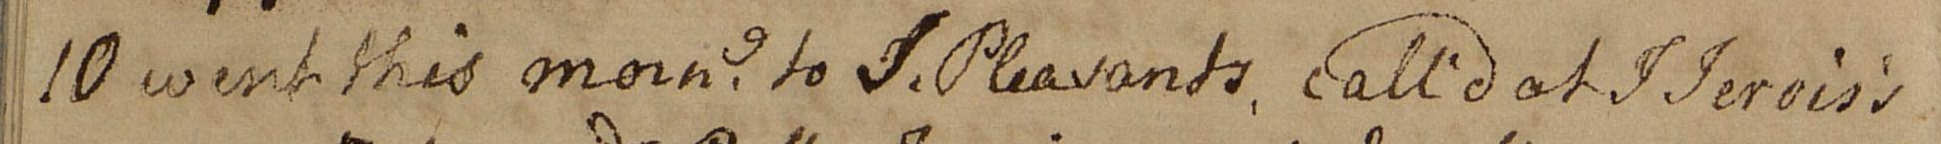10 went this morn^g. to S Pleasants, call'd at I Jervis's
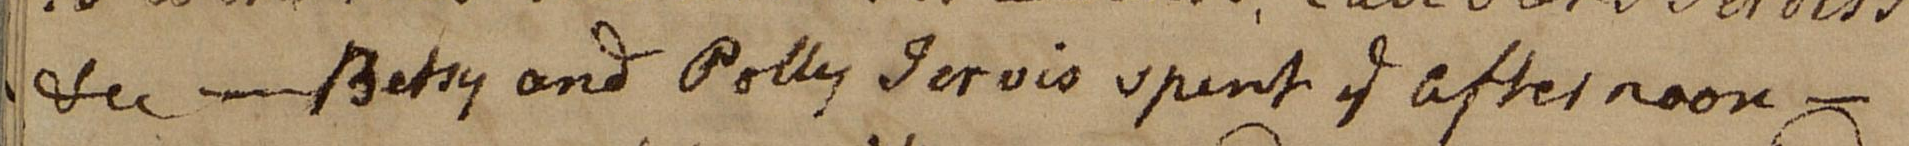&c - Betsy and Polly Jervis spent y^e after noon-
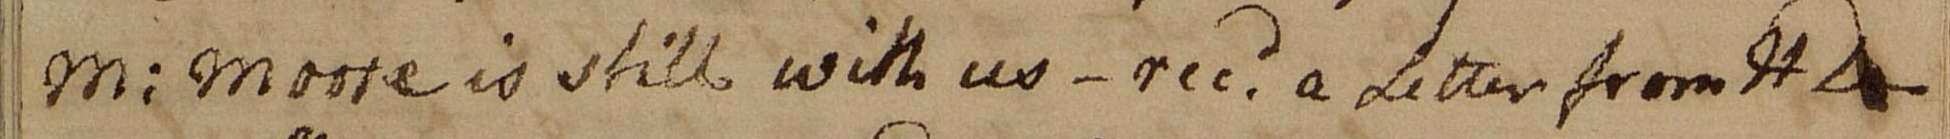M: Moore is still with us- rec^d. a Letter from HD-
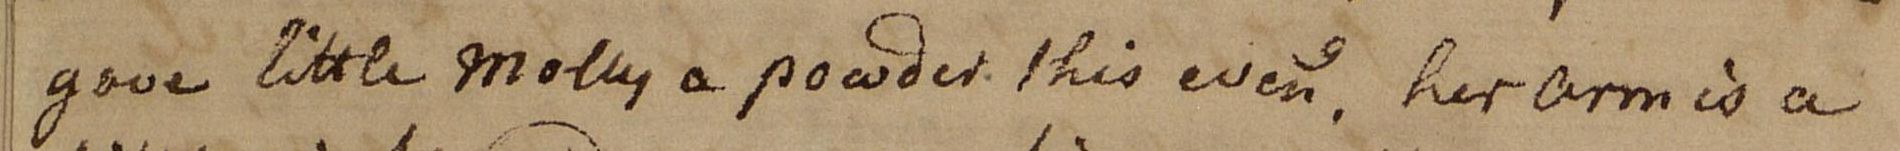gove little Molly a poader this even her Armis a
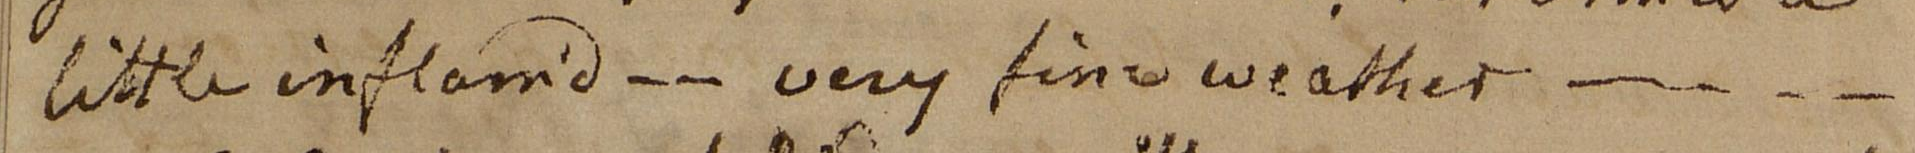little inflam'd-- very fine weather--
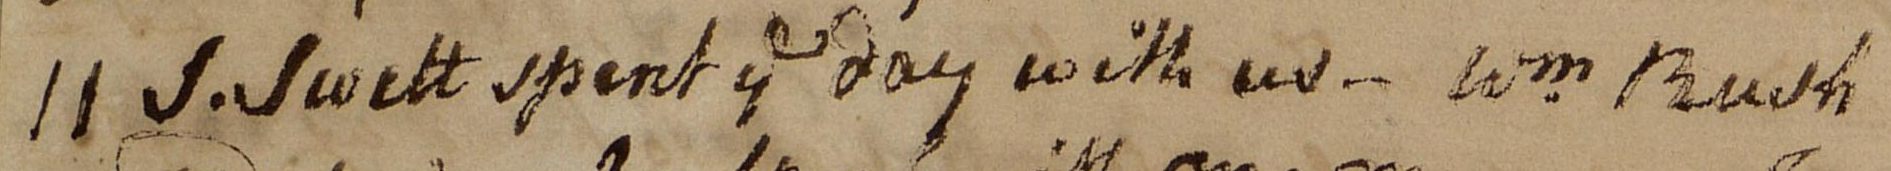11 S. Swett spent y^e day with us- W^m. Rush
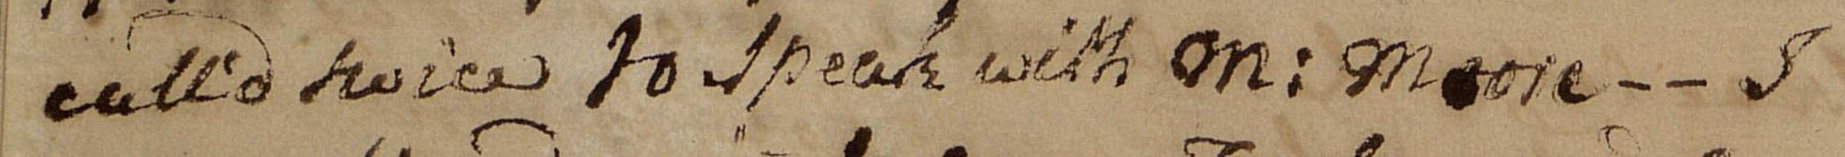call'd twice to Speak with M: Moore-- I
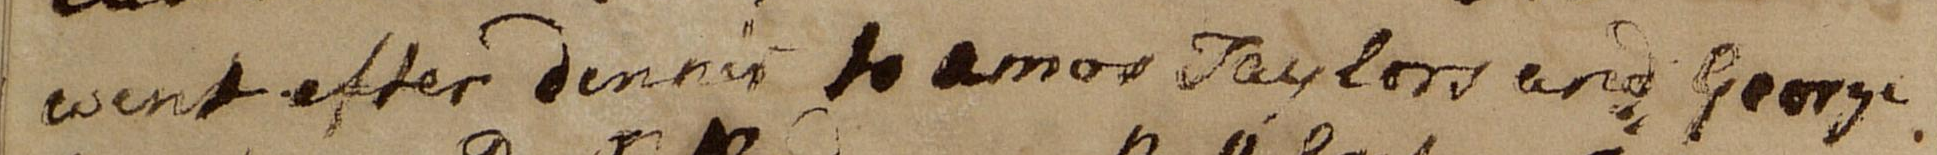went after dinner to Amos Taylors and George
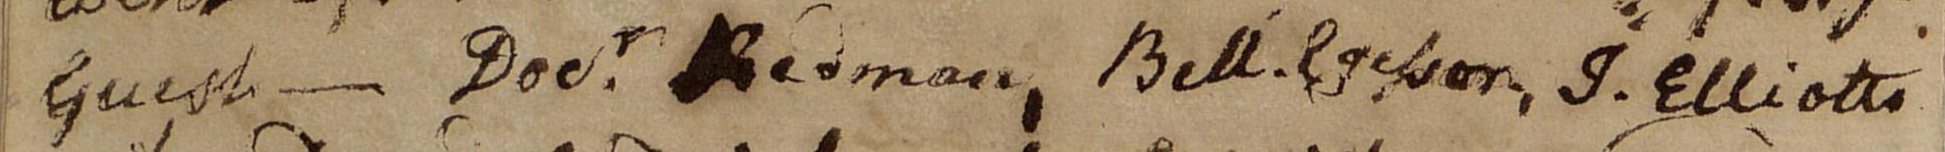Guest- Doc^r. Redman, Bell Cresson, I. Ellicotts
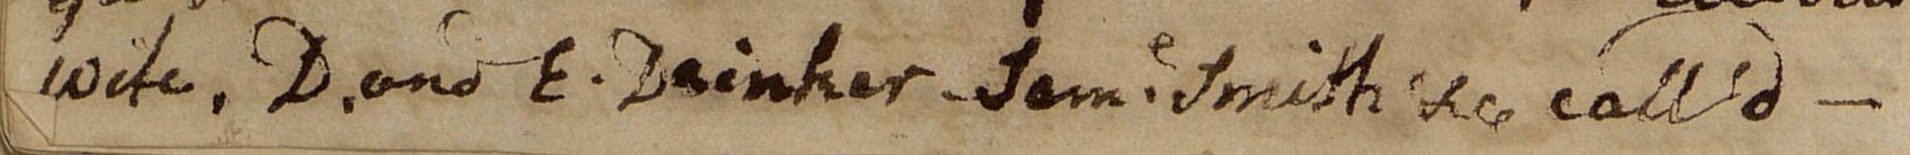wife, D. and E. Drinker- Sam^l. Smith &c call'd-
